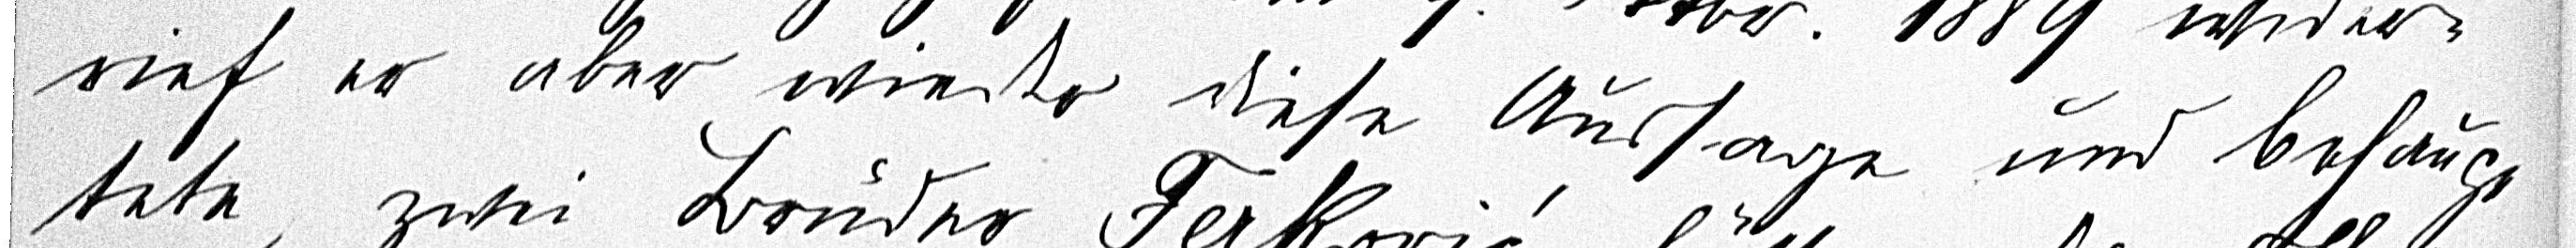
rief er aber wieder diese Aussage und behaup¬
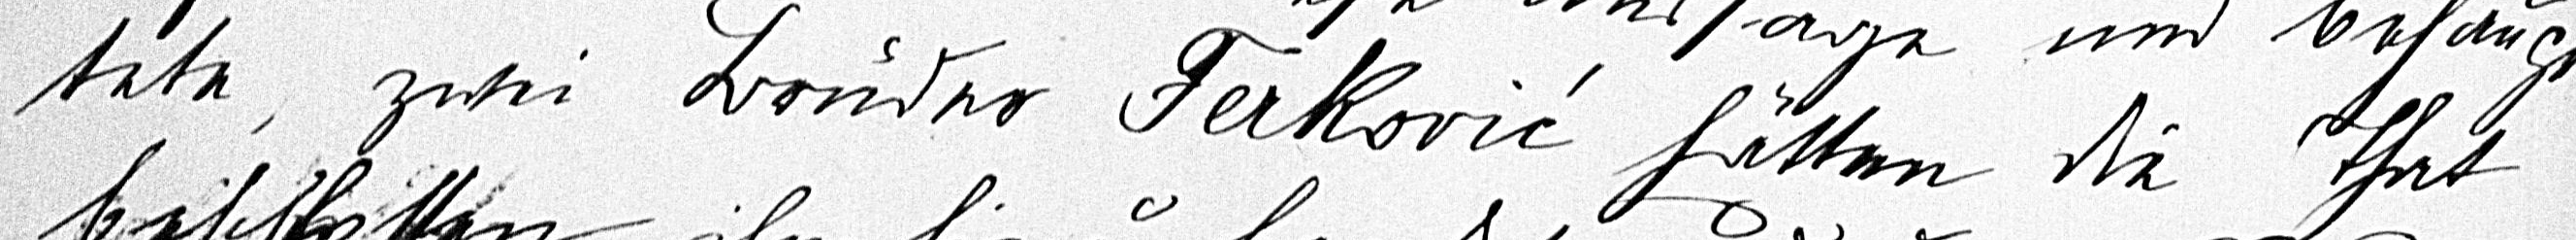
tete, zwei Brüder Ferković hätten die That
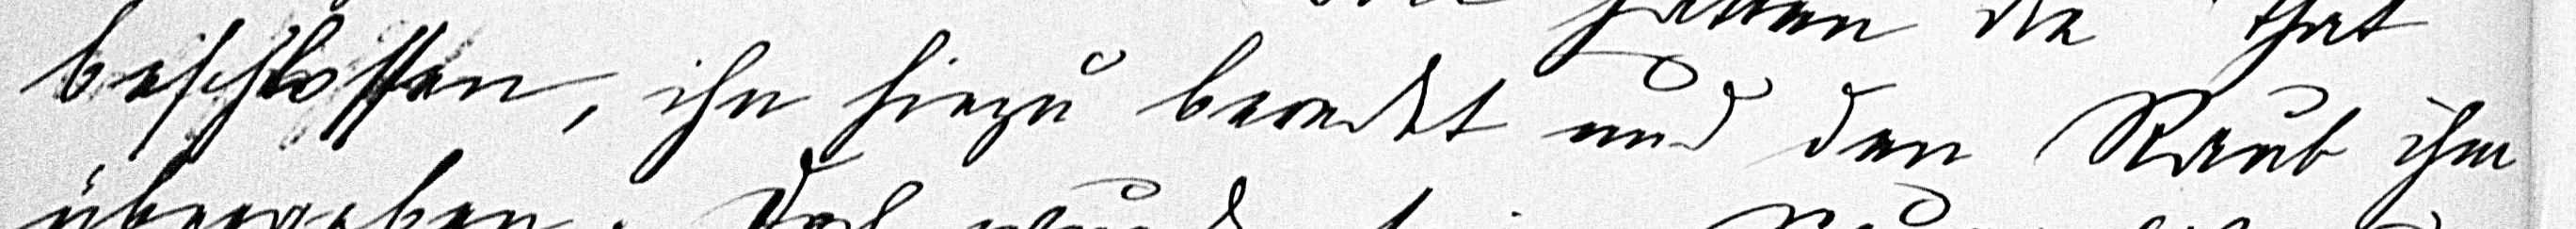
beschlossen, ihn hiezu beredet und den Raub ihm
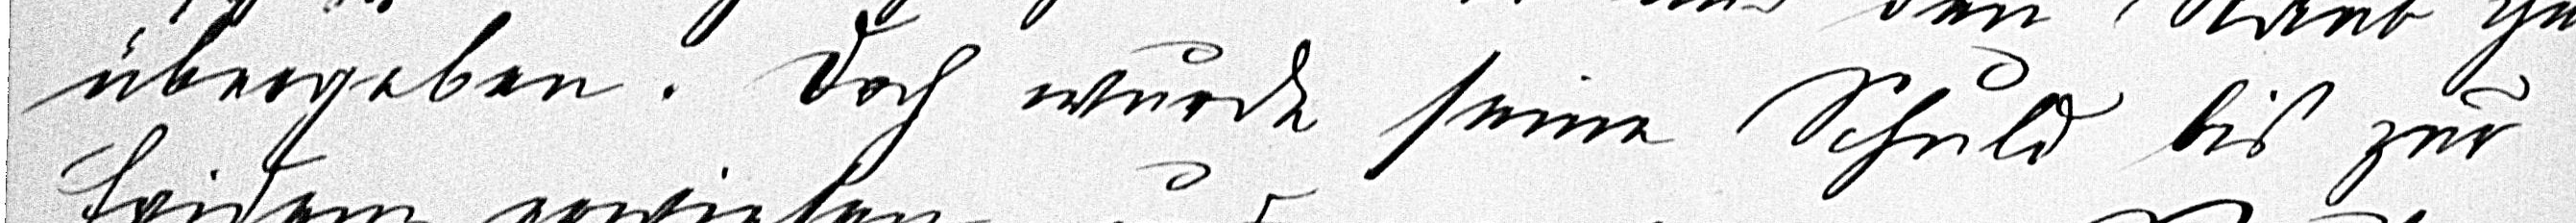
übergeben. Doch wurde seine Schuld bis zur
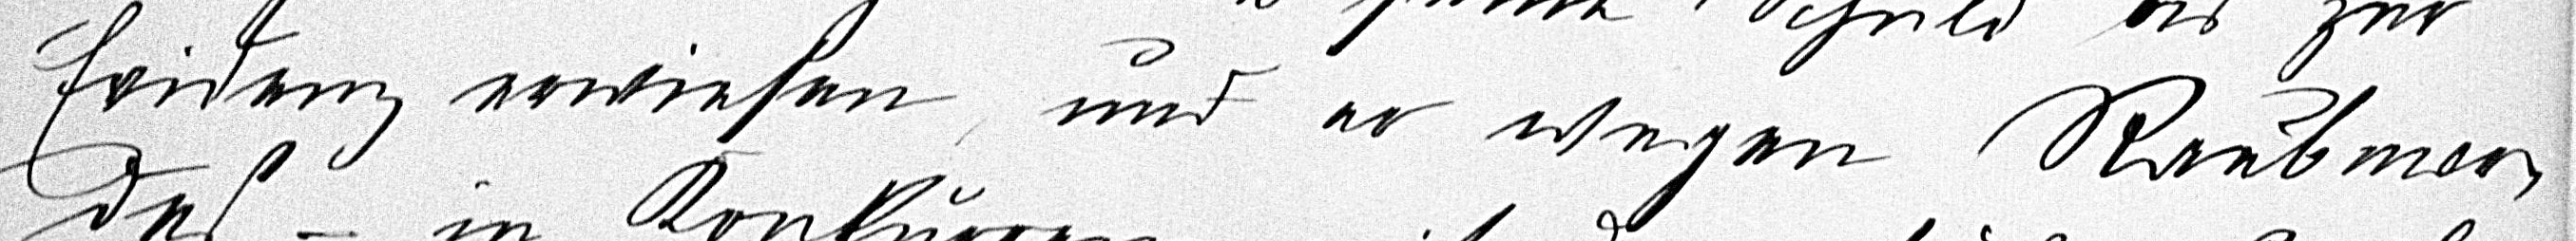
Evidenz erwiesen, und er wegen Raubmor,
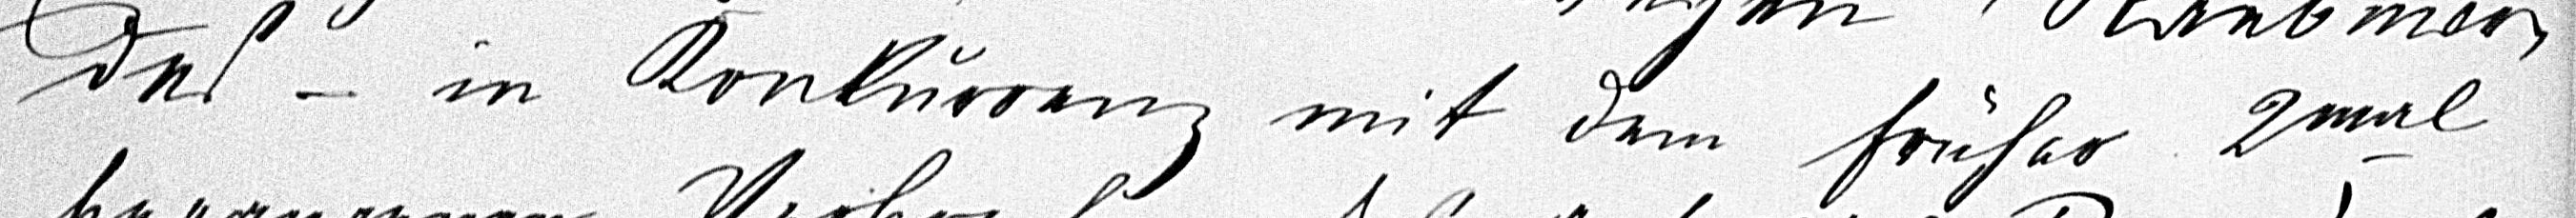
des - in Konkurrenz mit dem früher 2mal
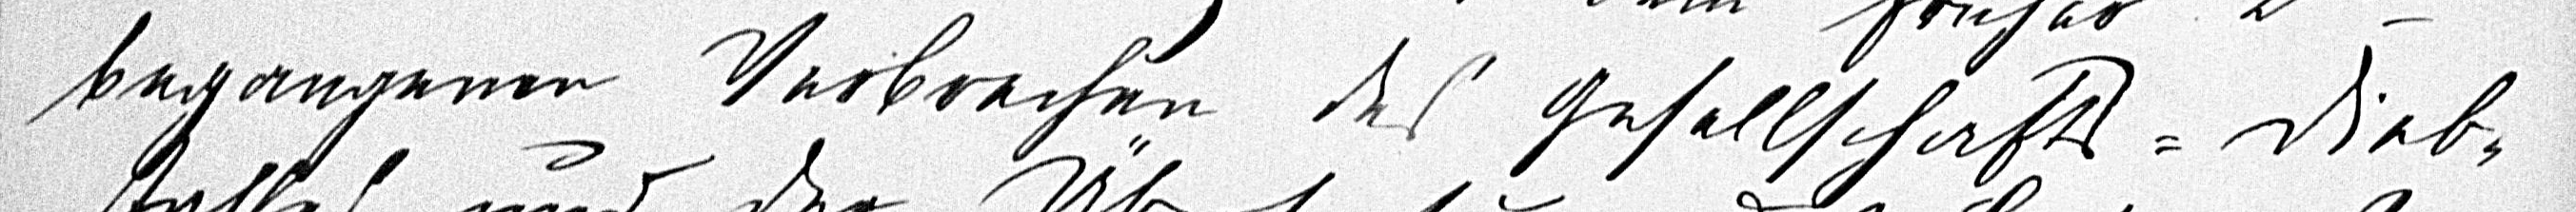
begangenen Verbrechen des Gesellschafts = Dieb¬
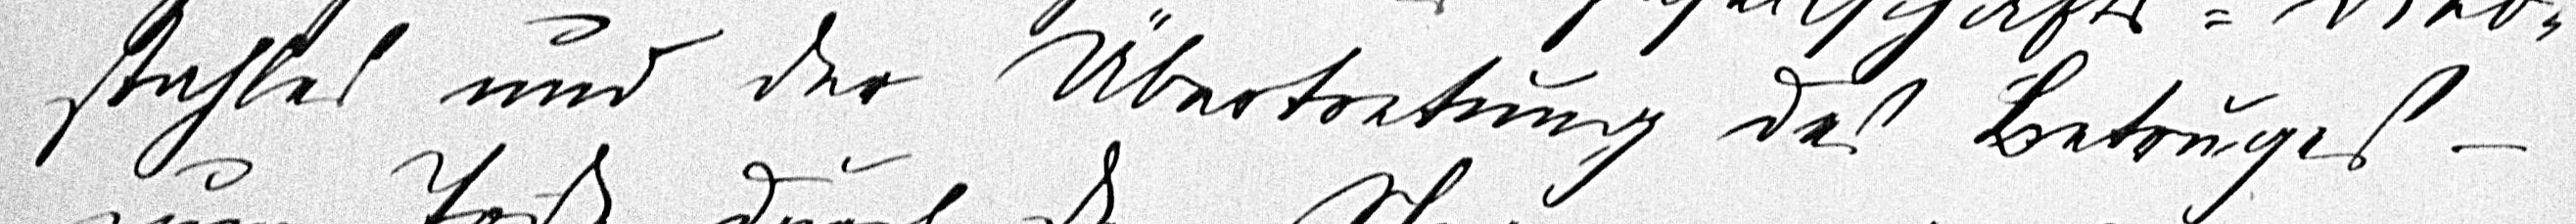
stahles und der Übertretung des Betruges -
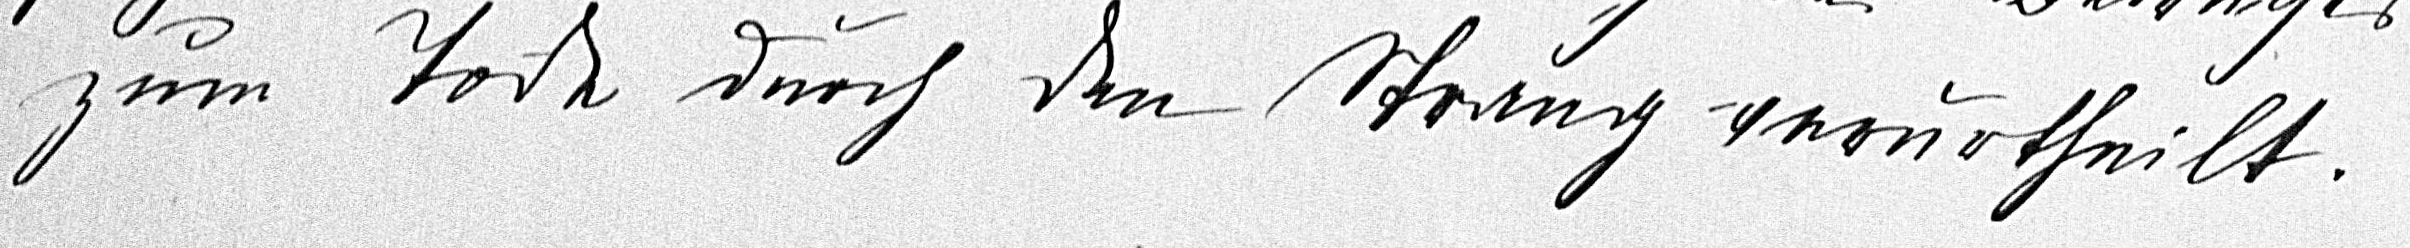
zum Tode durch den Strang verurtheilt.
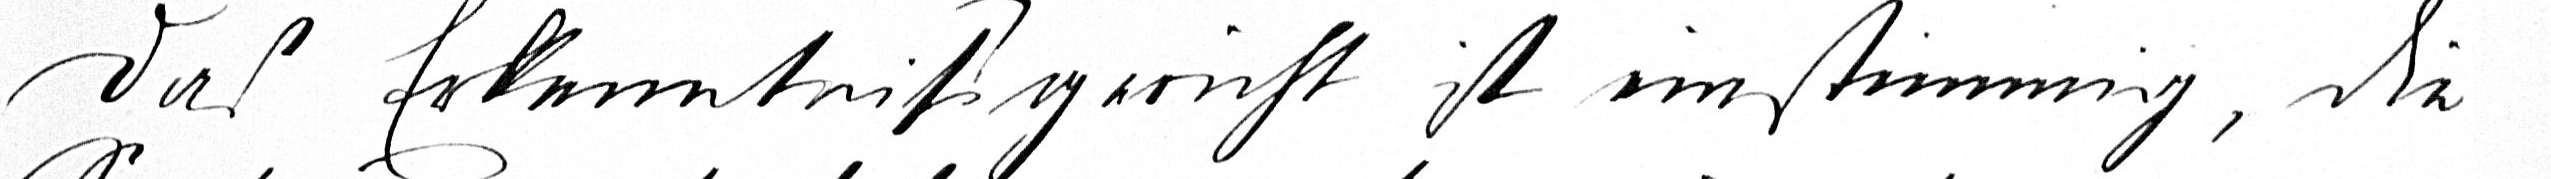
Das Erkenntnissgericht ist einstimmig, die
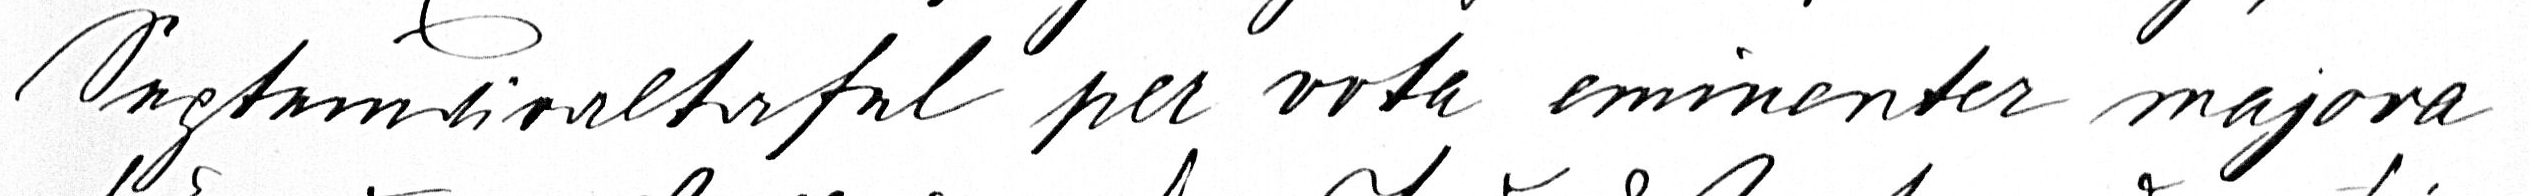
Septemviraltafel per vota eminenter majora
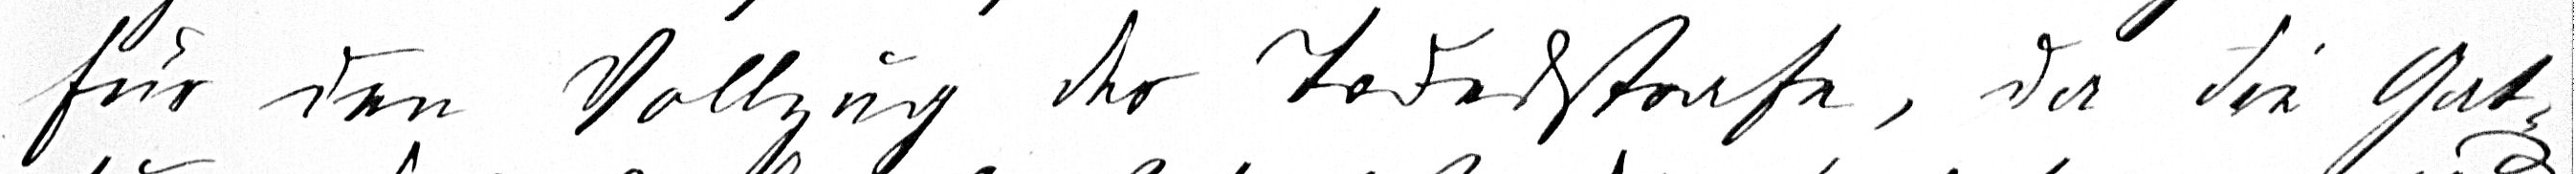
für den Vollzug der Todesstrafe, da die Gat¬
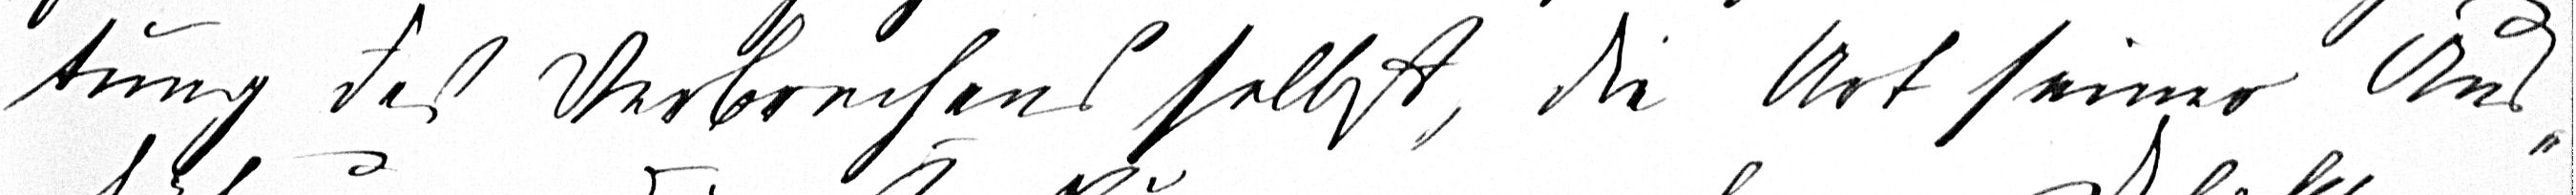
tung des Verbrechens selbst, die Art seiner Aus¬
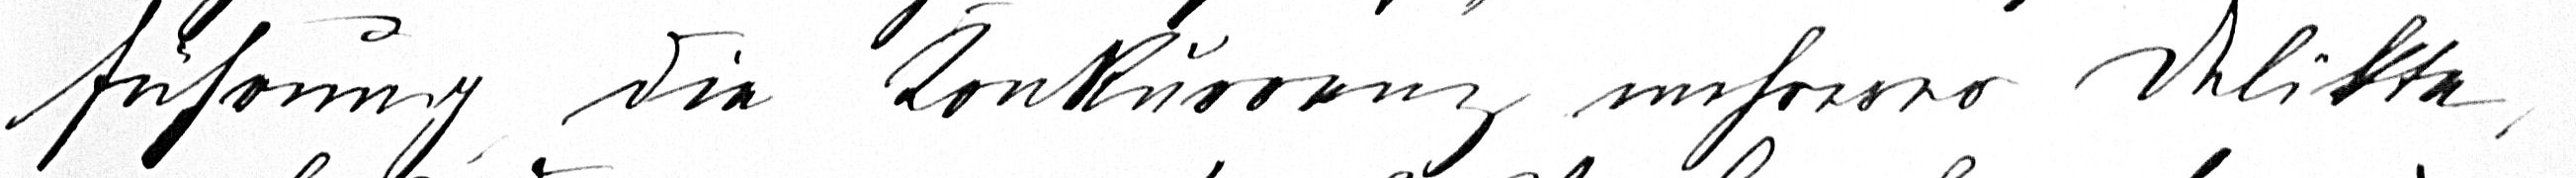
führung, die Konkurrenz mehrerer Delikte,
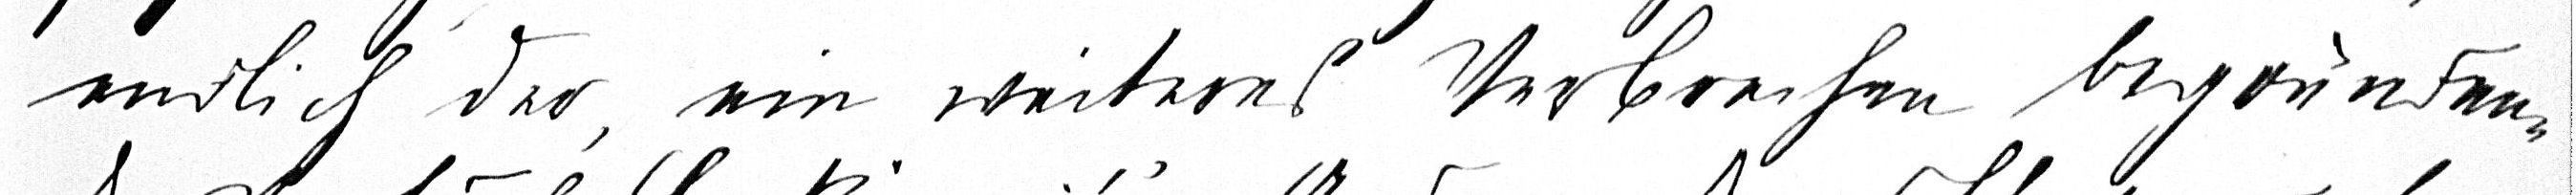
endlich der, ein weiteres Verbrachen begrüntende
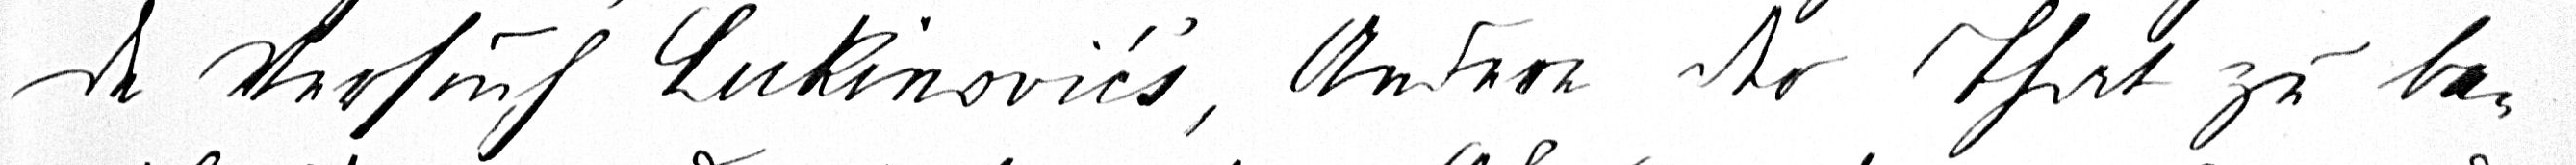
Versuch Lukinović's, Andereder That zu be¬
